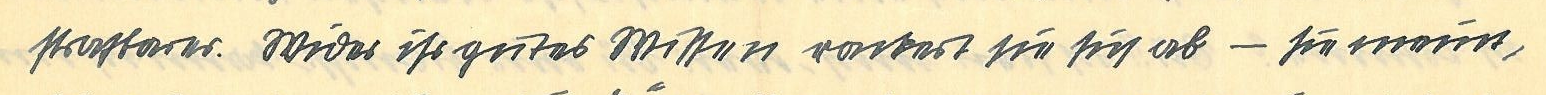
strafbarer. Wider ihr gutes Wissen rackert sie sich ab – sie meint,
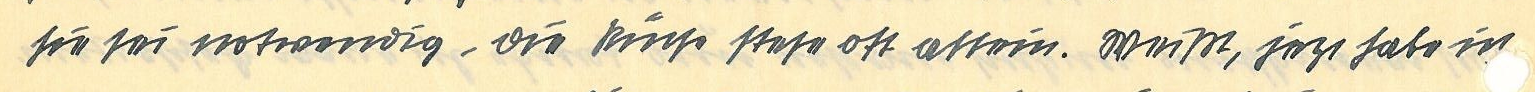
sie sei notwendig, die Küche stehe oft allein. Weißt, jetzt habe ich
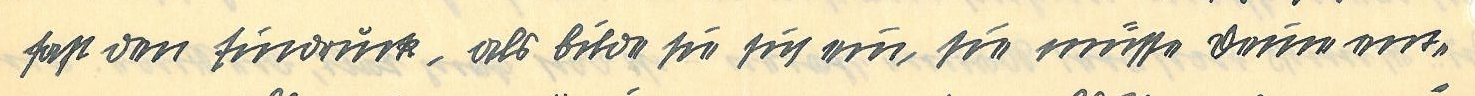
fast den Eindruck, als bilde sie sich ein, sie müsse Deine ent¬
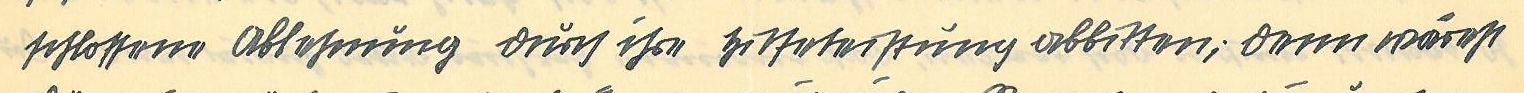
schlossene Ablehnung durch ihre Hilfeleistung abbitten; denn wärest
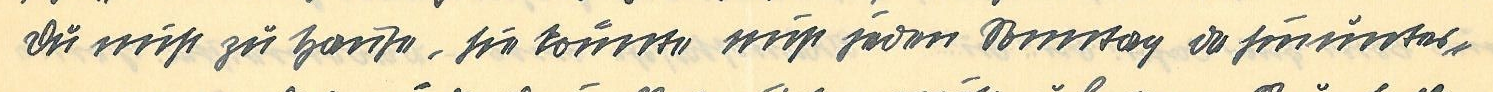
Du nicht zu Hause, sie könnte nicht jeden Sonntag da hinunter¬
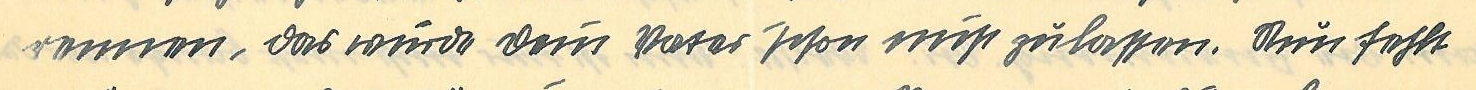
rennen, das würde Dein Vater schon nicht zulassen. Nun fehlt
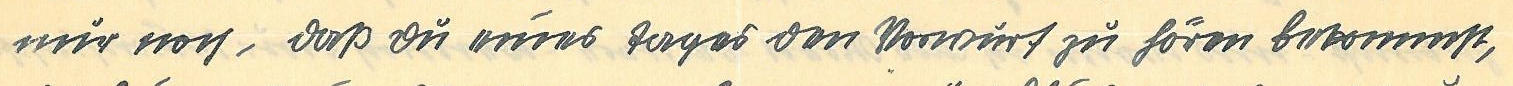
nur noch, daß Du eines Tages den Vorwurf zu hören bekommst,
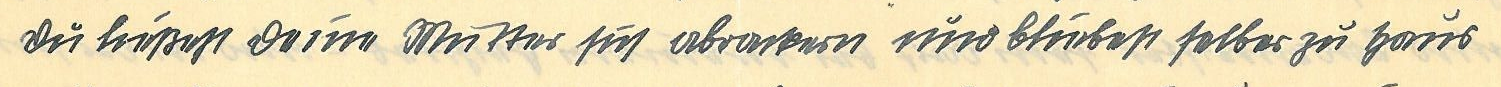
Du ließest die Mutter sich abrackern und bleibst selber zu Haus
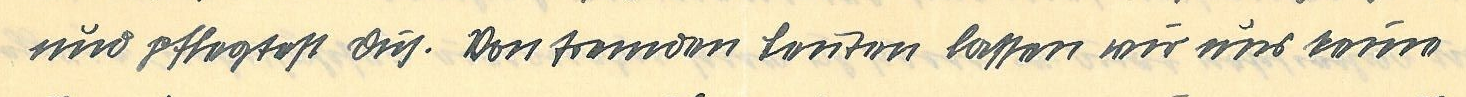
und pflegst Dich. Von fremden Leuten lassen wir uns keine
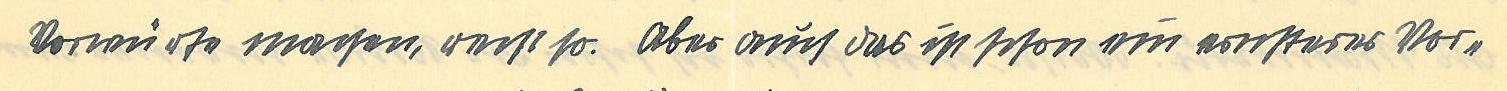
Vorwürfe machen, recht so. Aber auch das ist schon ein ernster Vor¬
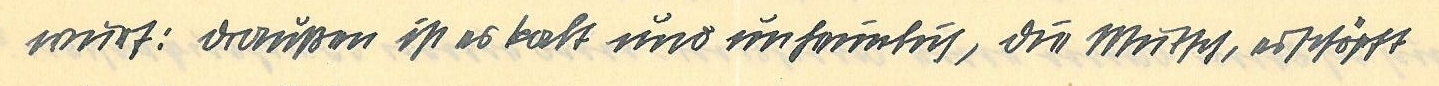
wurf: draußen ist es kalt und unheimlich, die Mutsch, erschöpft
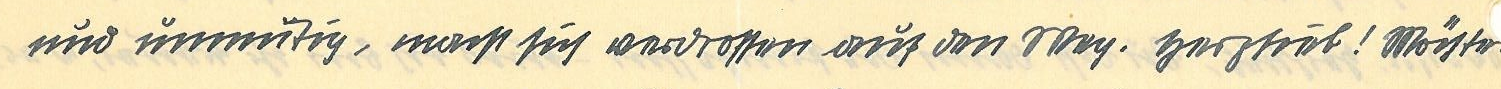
und unmutig, macht sich verdrossen auf den Weg. Herzlieb! Möcht
